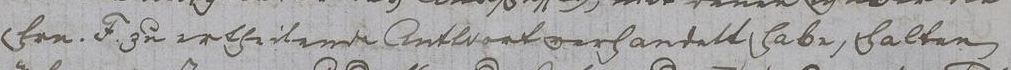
Hrn. F. zu ertheilende Antwort verhandelt habe, halten
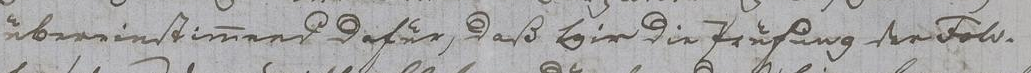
übereinstimmend dafür, daß wir die Prüfung der Fow -
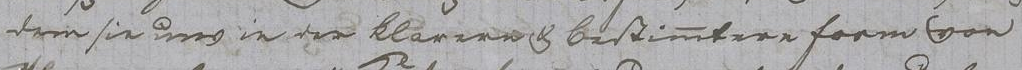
dem sie uns in der klarern & bestimmtern Form von
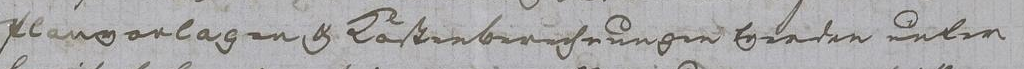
Planvorlagen & Kostenberechnungen werden unter-
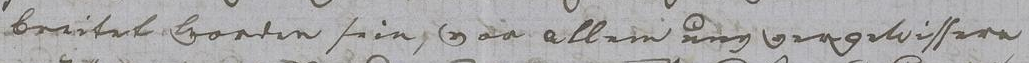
breitet worden sein, vor allem uns vergewissern
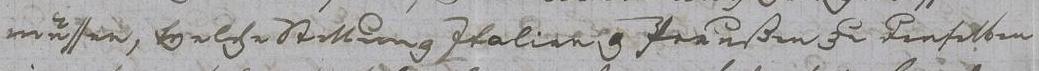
müssen, welche Stellung Italien & Preußen zu denselben
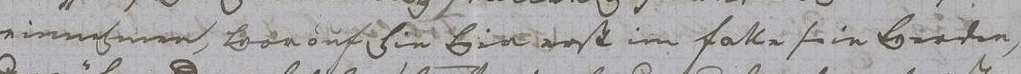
einnehmen, woraufhin wir erst im Falle sein werden,
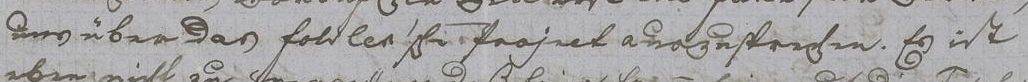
uns über das Fowler'sche Project auszusprechen. Es ist
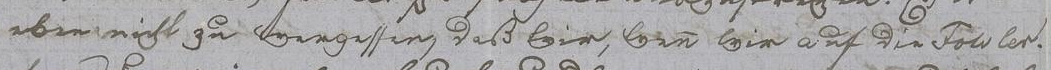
eben nicht zu vergessen, daß wir, wenn wir auf die Fowler-
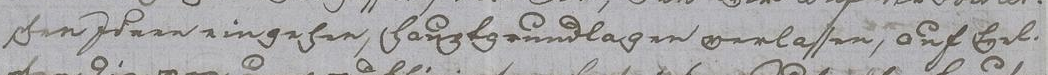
schen Ideen eingehen, Hauptgrundlagen verlassen, auf wel-
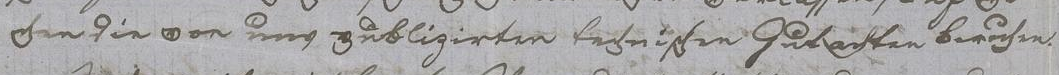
chen die von uns publizirten technischen Gutachten beruhen.
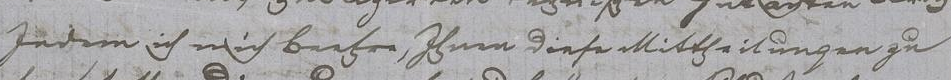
Indem ich mich beehre, Ihnen diese Mittheilungen zu
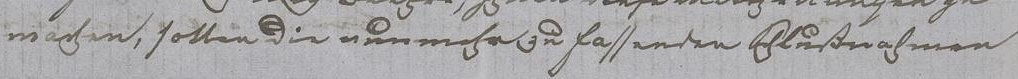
machen, sollen die nunmehr zu fassenden Schlußnahmen
